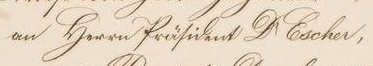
an Herrn Präsident Dr Escher,
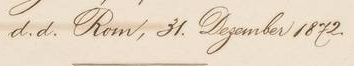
d. d. Rom, 31. Dezember 1872.
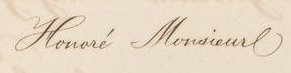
Honoré Monsieur
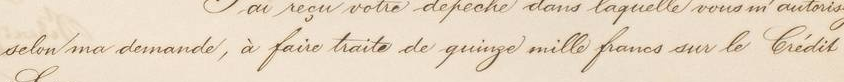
selon ma demande, à faire traite de quinze mille francs sur le Crédit
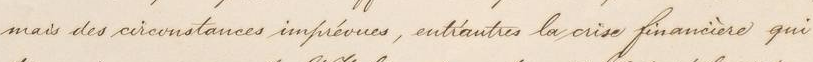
mais des circonstances imprévues, entr'autres la crise financière qui
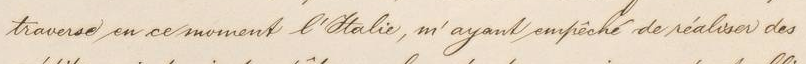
traverse en ce moment l'Italie, m'ayant empêché de réaliser des
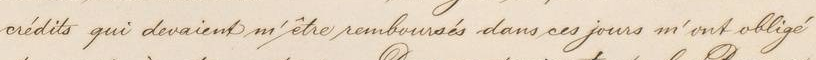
crédits qui devaient m'être remboursés dans ces jours m'ont obligé
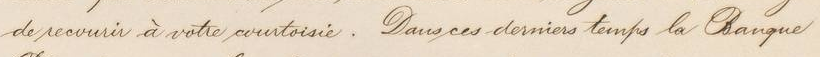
de recourir à votre courtoisie. Dans ces derniers temps la Banque
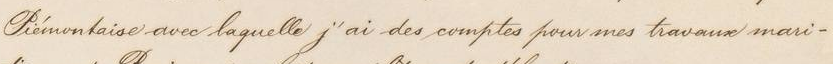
Piémontaise avec laquelle j'ai des comptes pour mes traveaux mari-
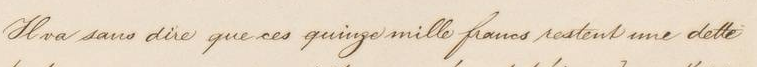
Il va sans dire que ces quinze mille francs restent une dette
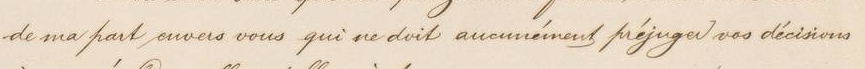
de ma part envers vous qui ne doit aucunément préjuger vos décisions
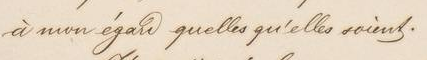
à mon égard quelles qu'elles soient.
